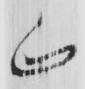㠯（以）
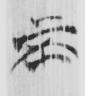不
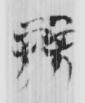辡
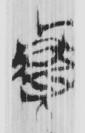貴
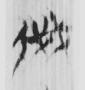俴
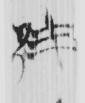隹
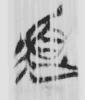道
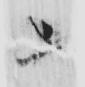之
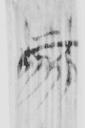所
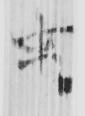才
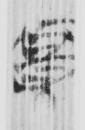貴
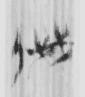俴
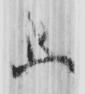之
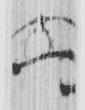立
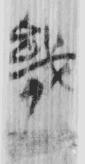幾
